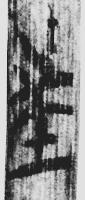市
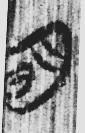明
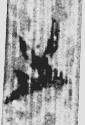之
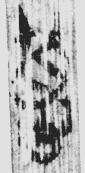惪（德）
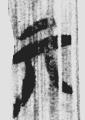亓（其）
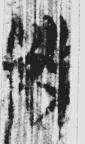殜（世）
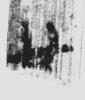也
